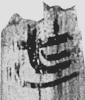必
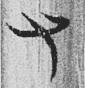又（有）
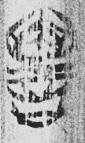○（數）
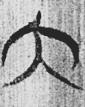大
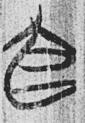官
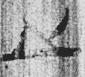之
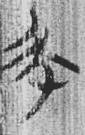○（師）
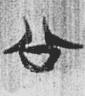公
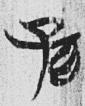孫
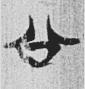公
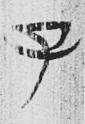子
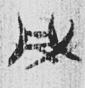凡
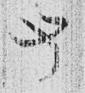又（有）
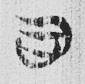司
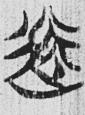○（率）
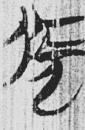倀（長）
